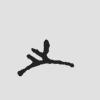出
